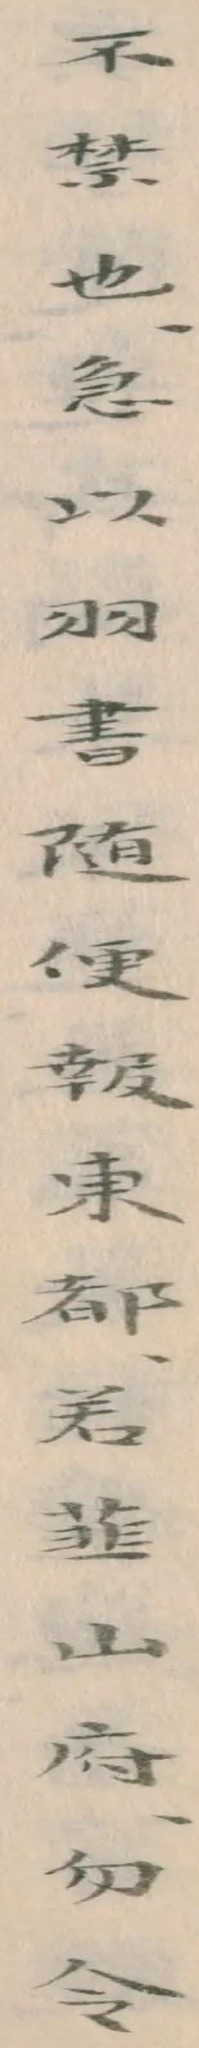不禁也、急以羽書随便報東都、若韮山府、勿令
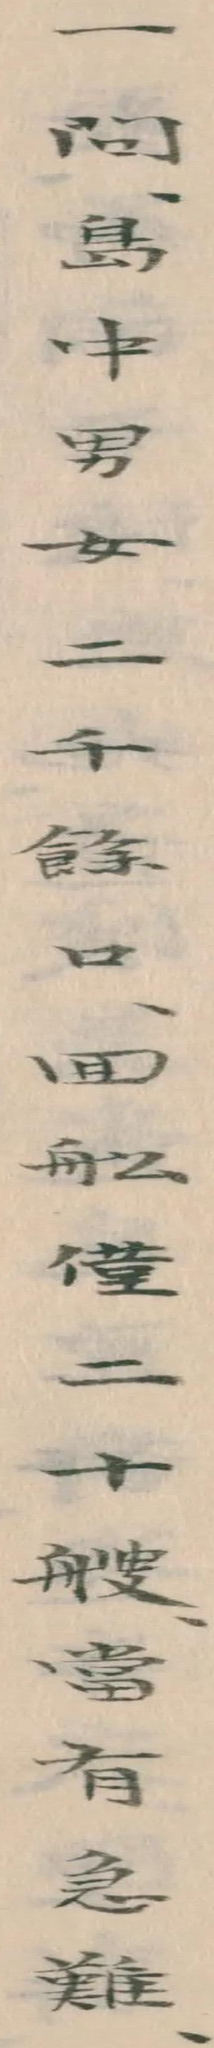一問、島中男女二千余口、回船僅二十艘、当有急難、
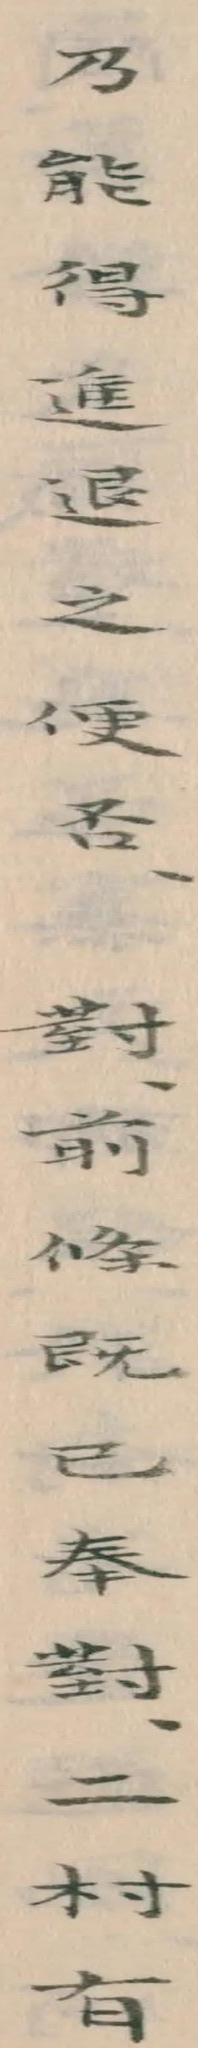乃能得進退之便否、対、前条既已奉対、二村有
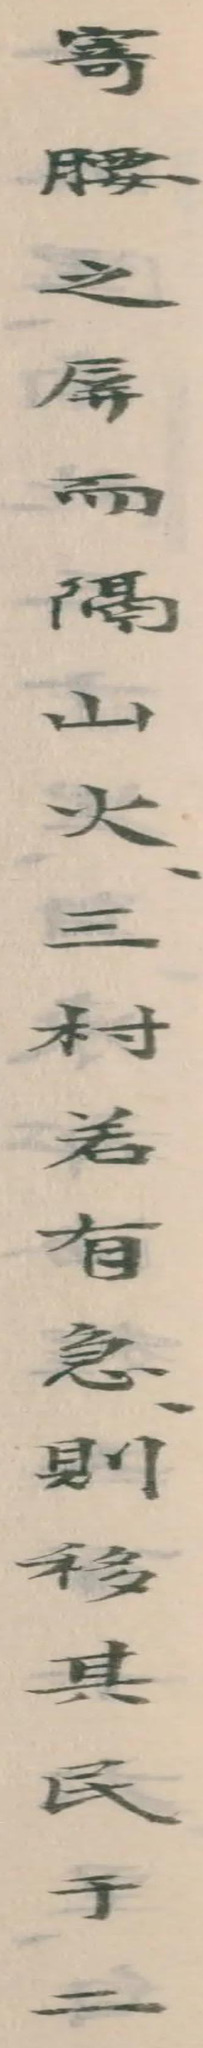寄腰之屏而隔山火、三村若有急、則移其民于二
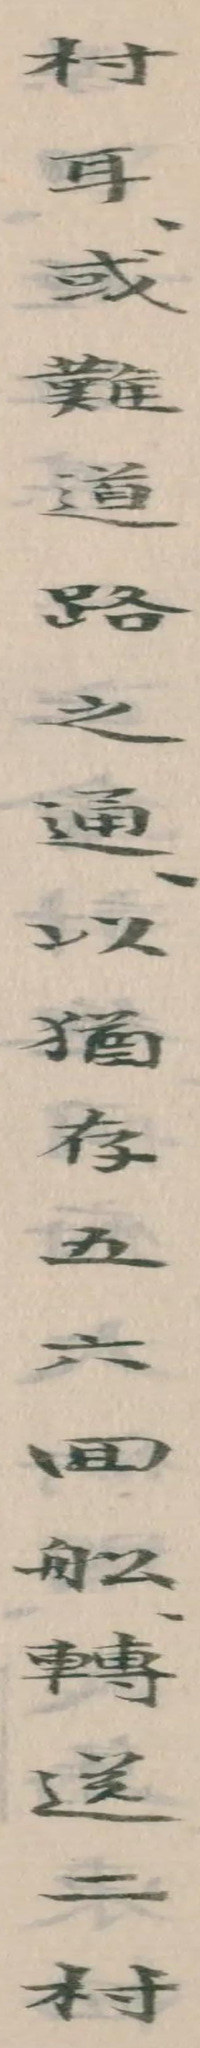村耳、或難道路之通、以猶在五六回船、伝送二村
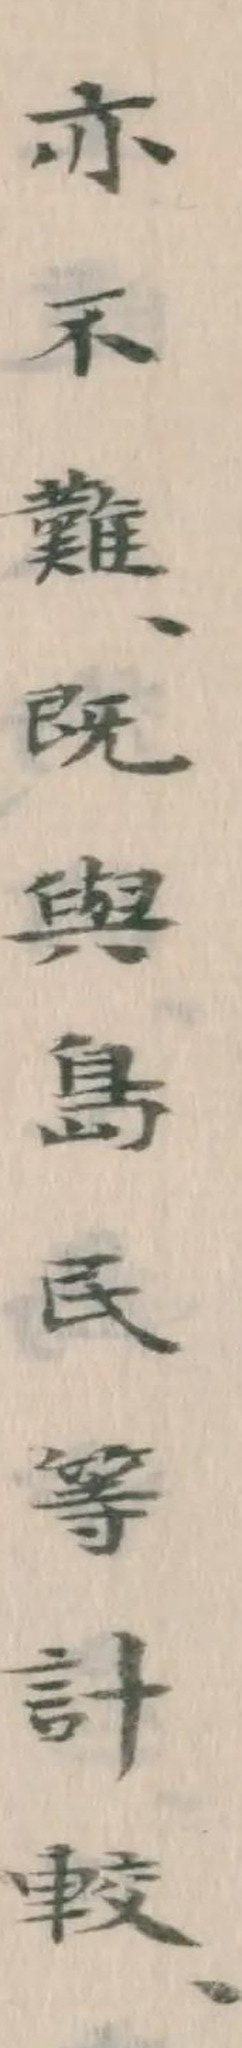亦不難、既与島民等計較、
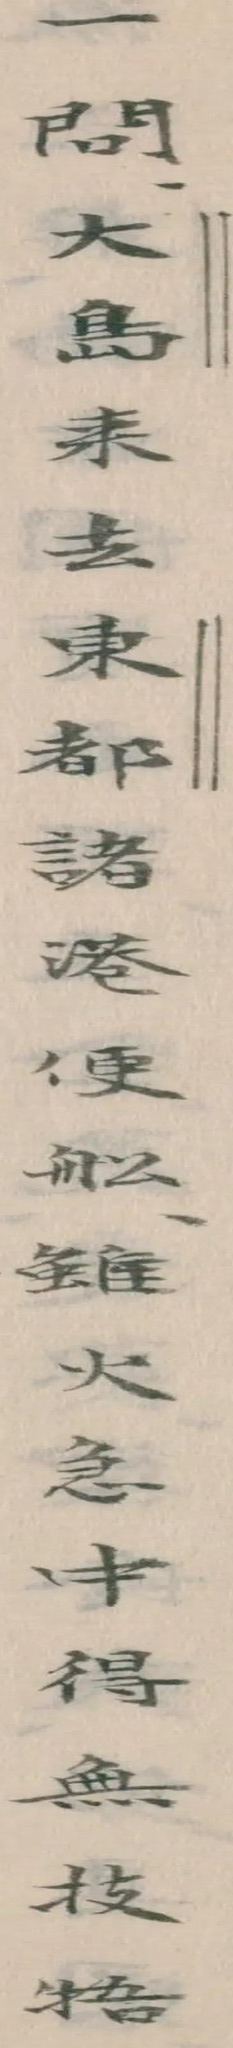一問、大島来去東都諸港便船、雖火急中得無技牾
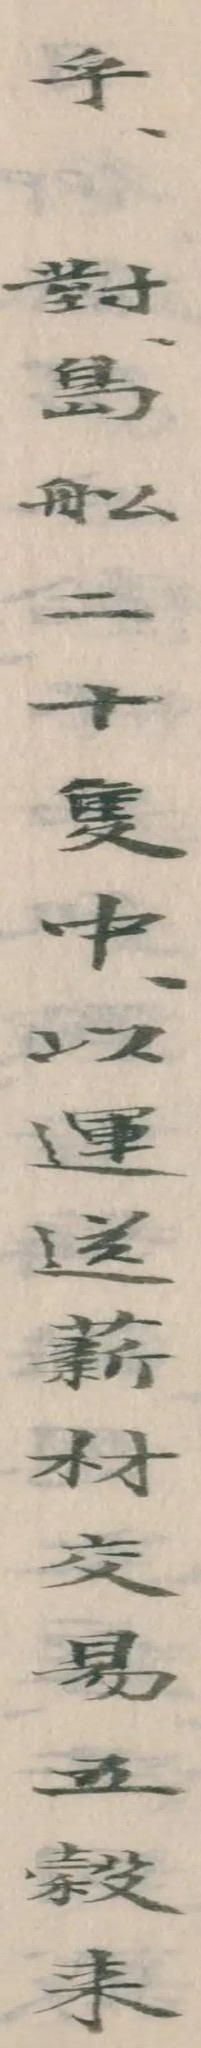乎、対、島船二十隻中、以運送薪材交易五穀来
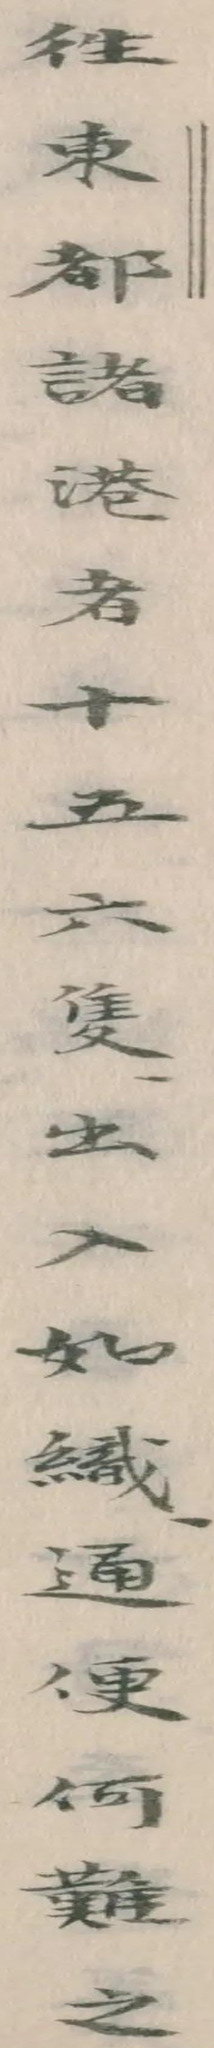往東都諸港者十五六隻、出入如織、通便何難之
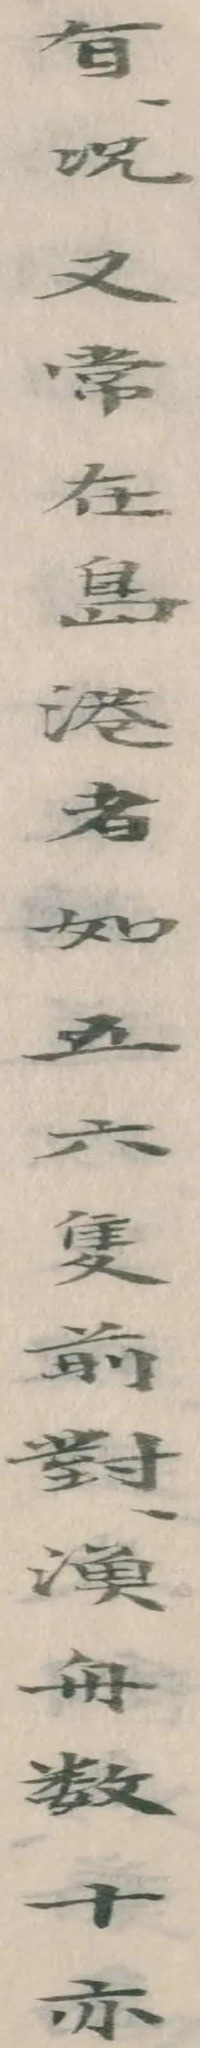有、况又常在島港者如五六隻前対、漁舟数十亦
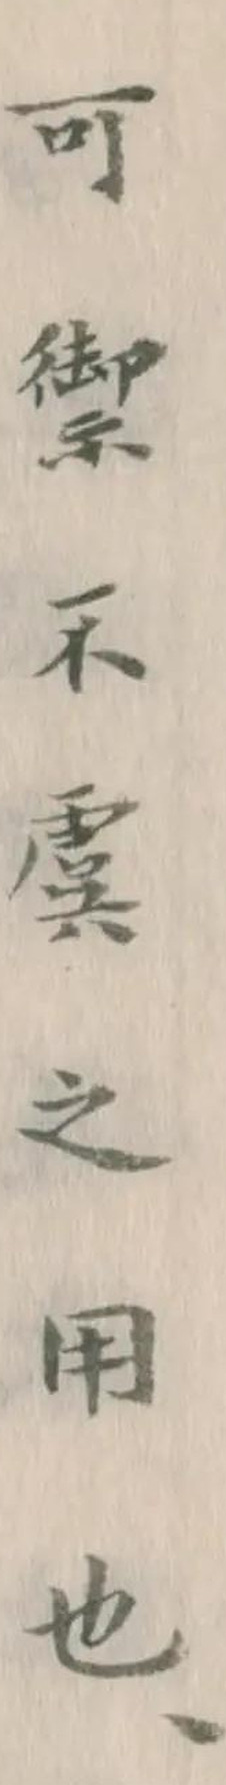可禦不虞之用也、
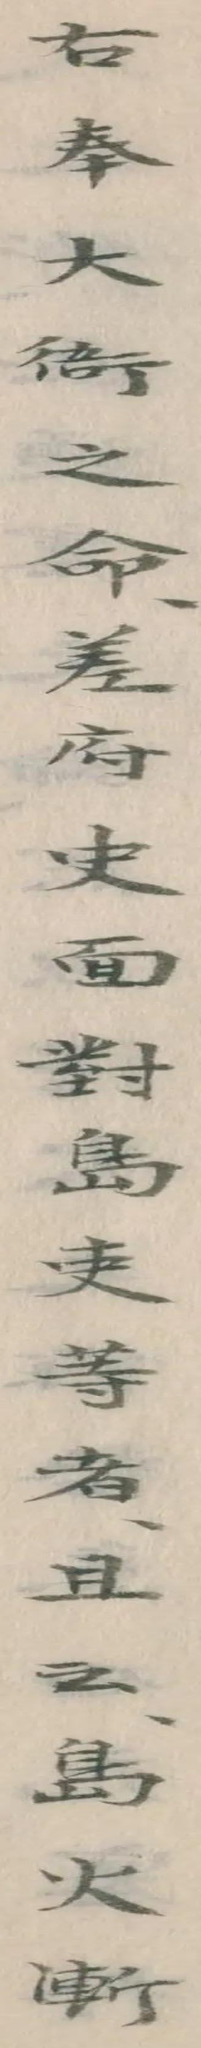右奉大衙之命、差府史面対島吏等者、且云、島火漸
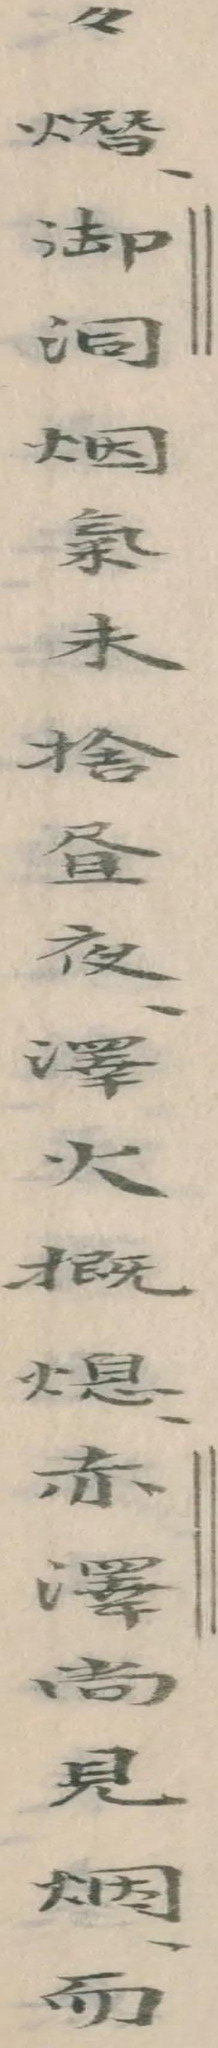々熸、御洞烟気未捨昼夜、沢火概熄、赤沢尚見烟、而

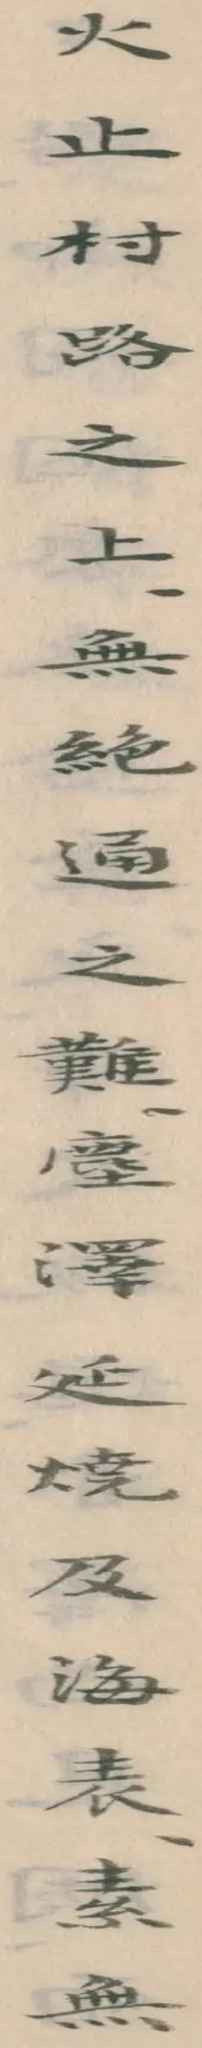火止村路之上、無絶通之難、塵沢延焼及海表、素無
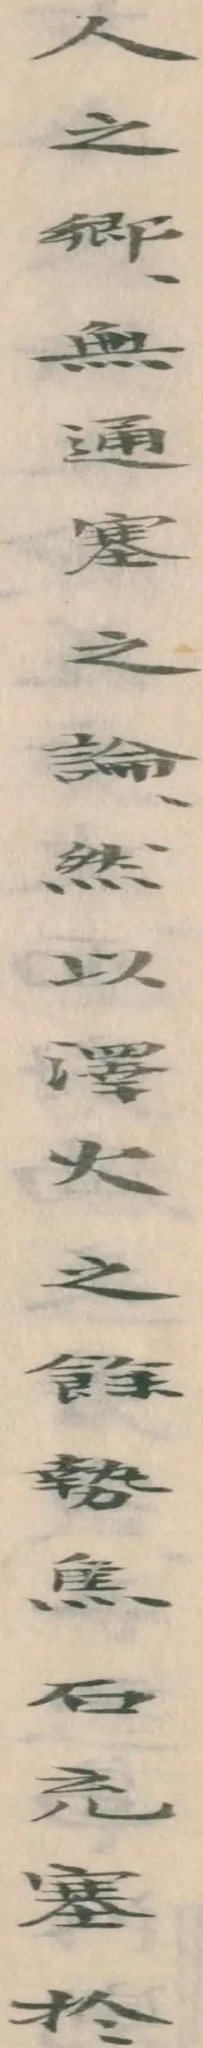人之郷、無通塞之論、然以沢火之余勢焦石充塞於
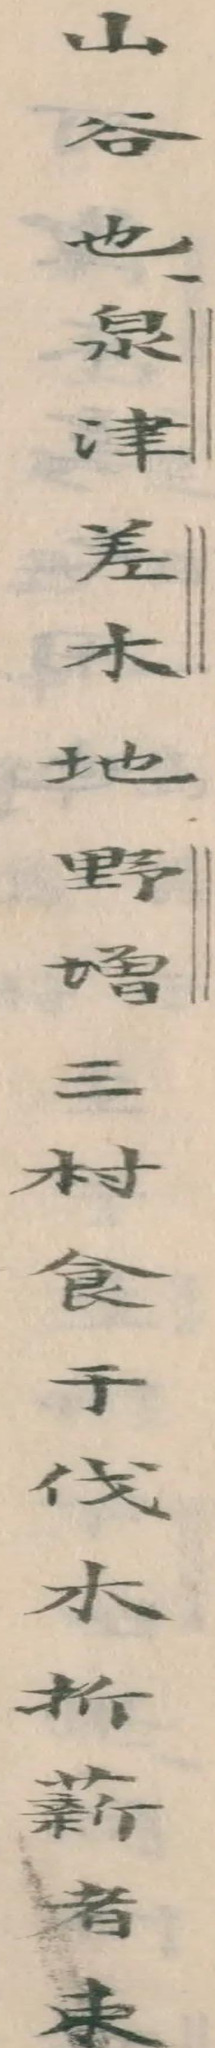山谷也、泉津差木地野増三村食于伐木折薪者束
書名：地災撮要. 巻11-12(地震之部)
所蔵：国立国会図書館 National Diet Library, JAPAN
